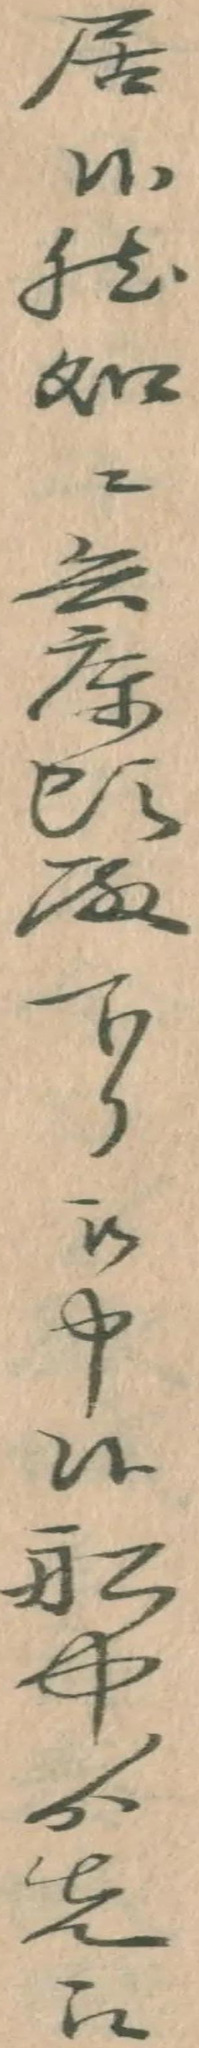居候然処に兵庫頭殿下り被申候舩中ゟ先江
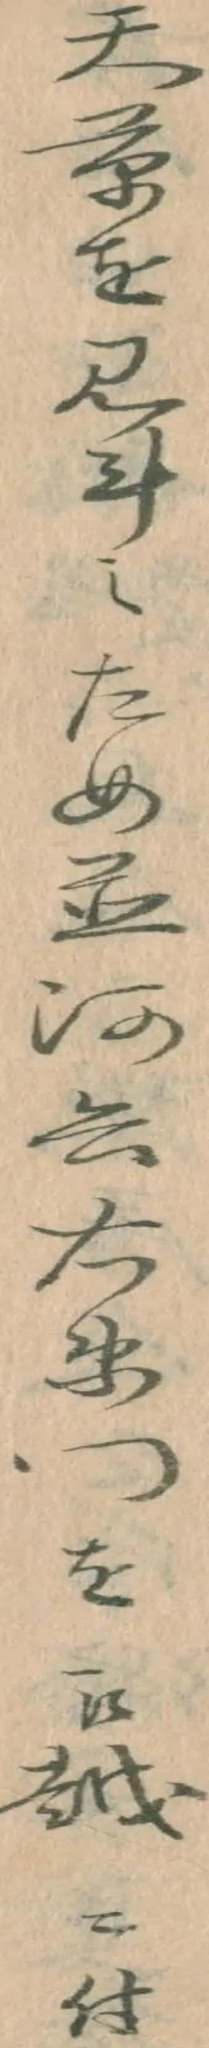天草を見斗之ため並河兵右衛門を被越に付

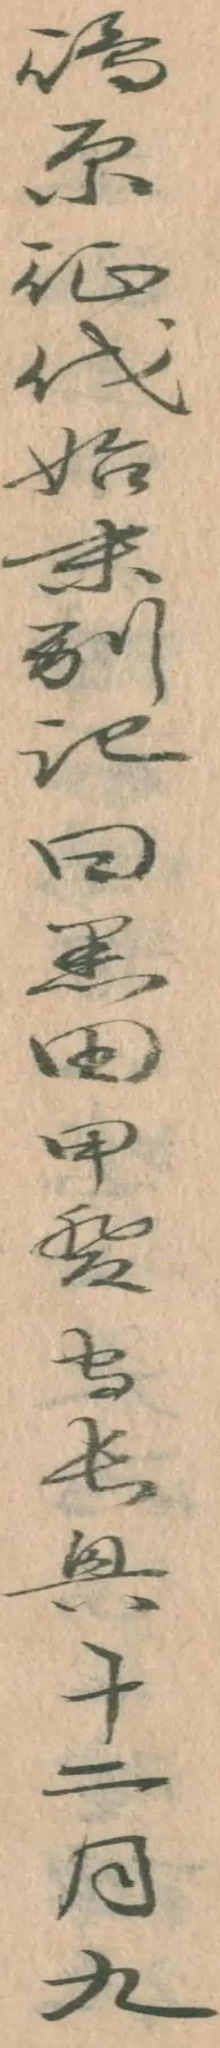島原征伐始末別記曰黒田甲斐守長奥十二月九
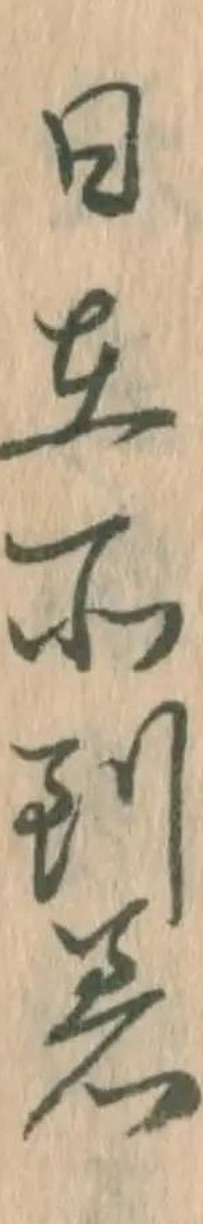日在所到着
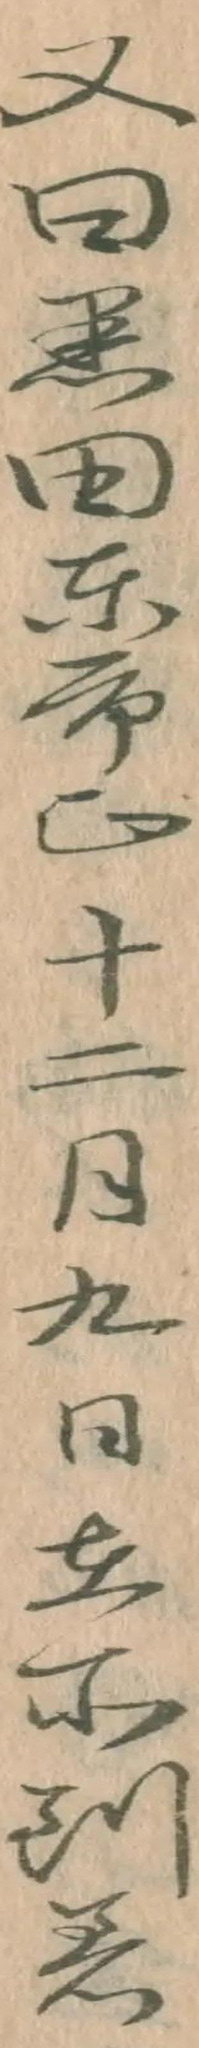又曰黒田東市正十二月九日在所到着
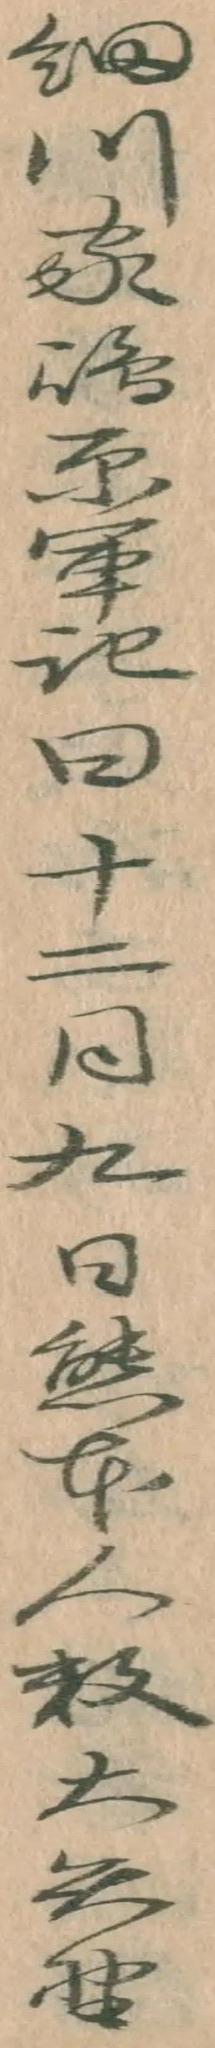細川家島原軍記曰十二月九日熊本人数大矢野
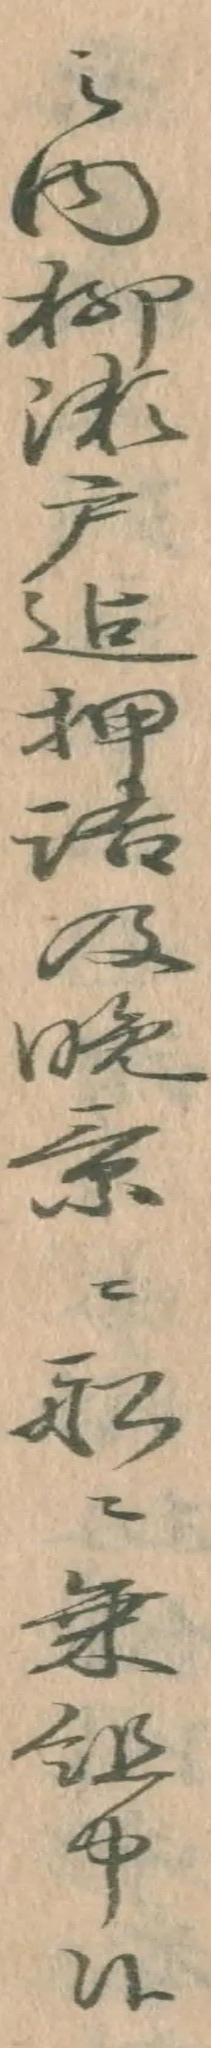之内柳瀬戸迄押詰及晩景に舩に乗組申候
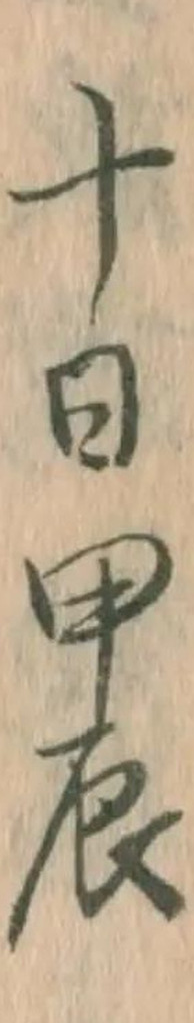十日甲辰
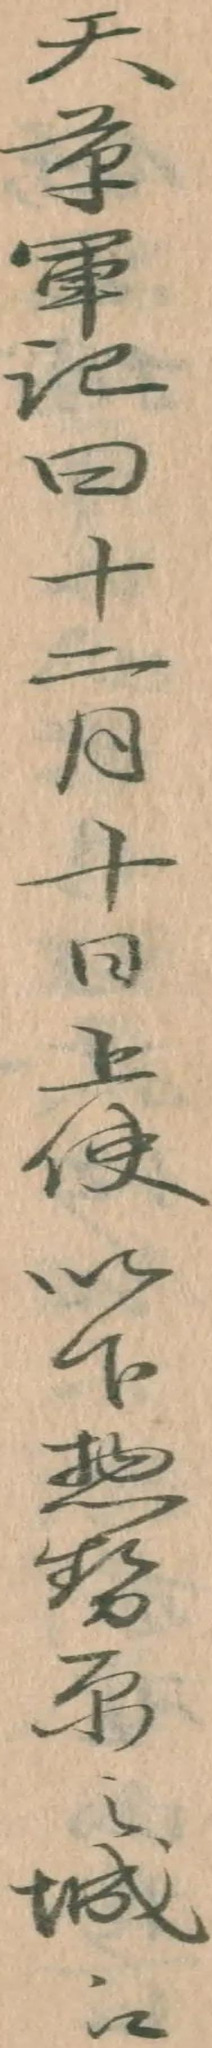天草軍記曰十二月十日上使以下惣勢原之城江
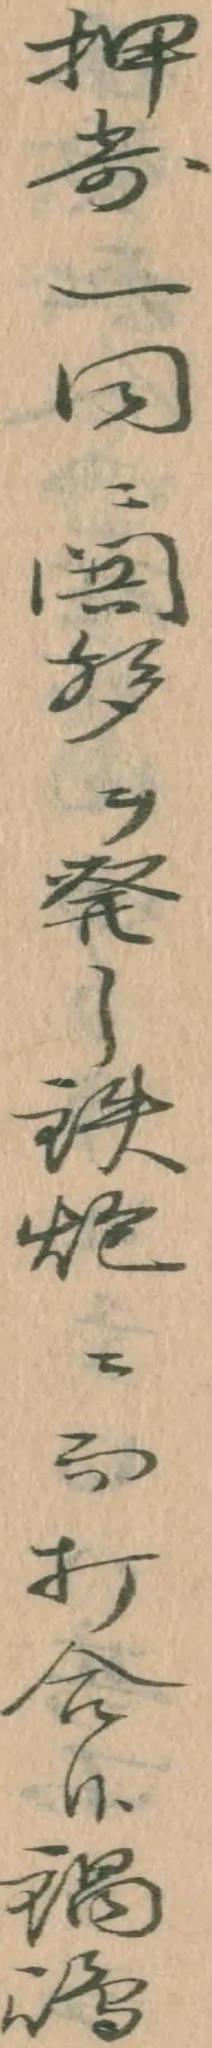押寄一同に鬨声を発し鉄炮に而打合候鍋島
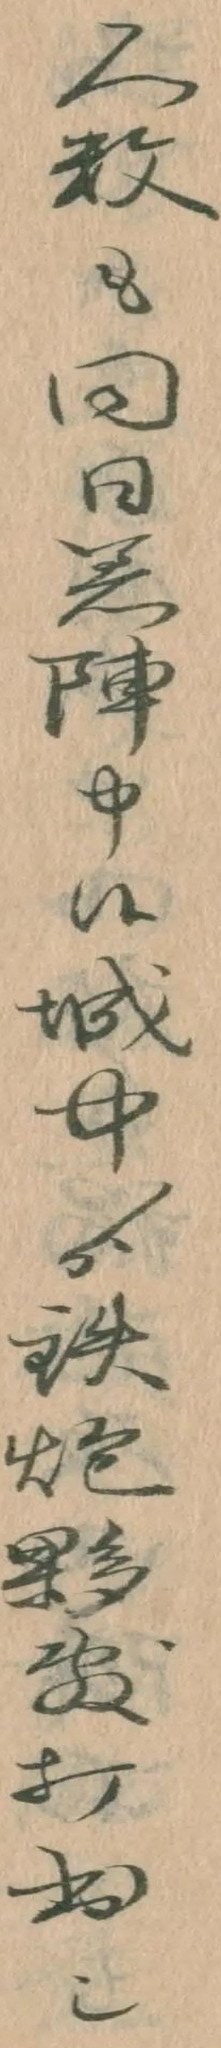人数も同日着陣申候城中ゟ鉄炮夥敷打出し
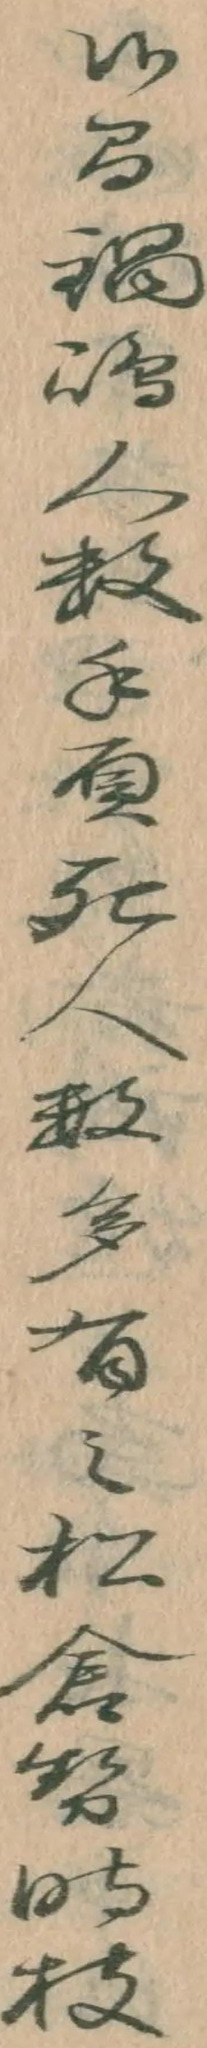候間鍋島人数手負死人数多有之松倉勢時枝
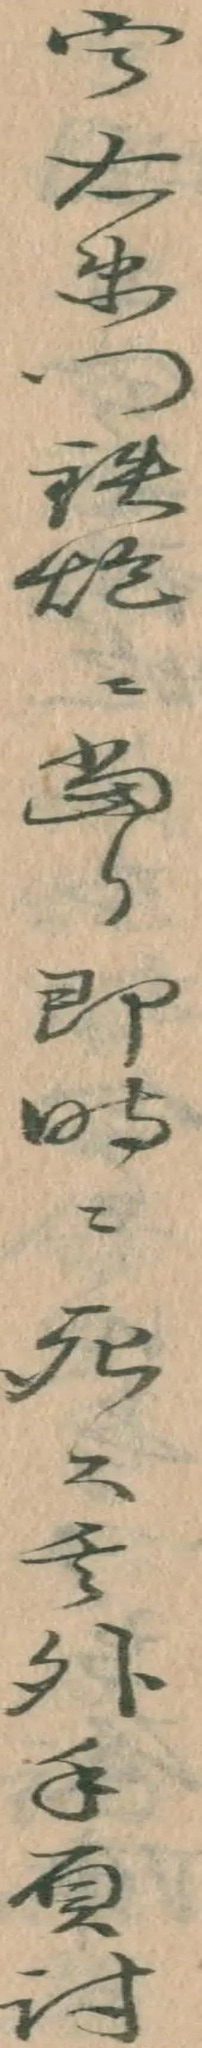宇右衛門鉄炮に当り即時に死す其外手負討
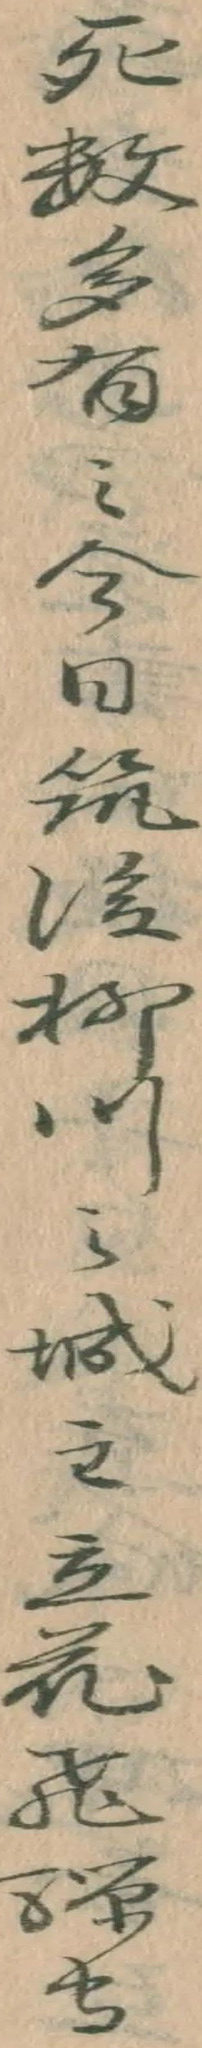死数多有之今日筑後柳川之城主立花飛騨守
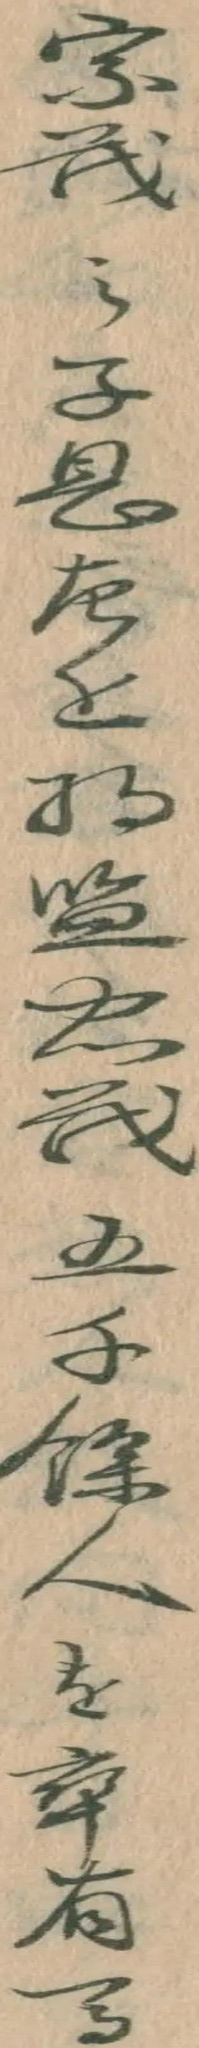宗茂之子息左近将監忠茂五千余人を卒有馬
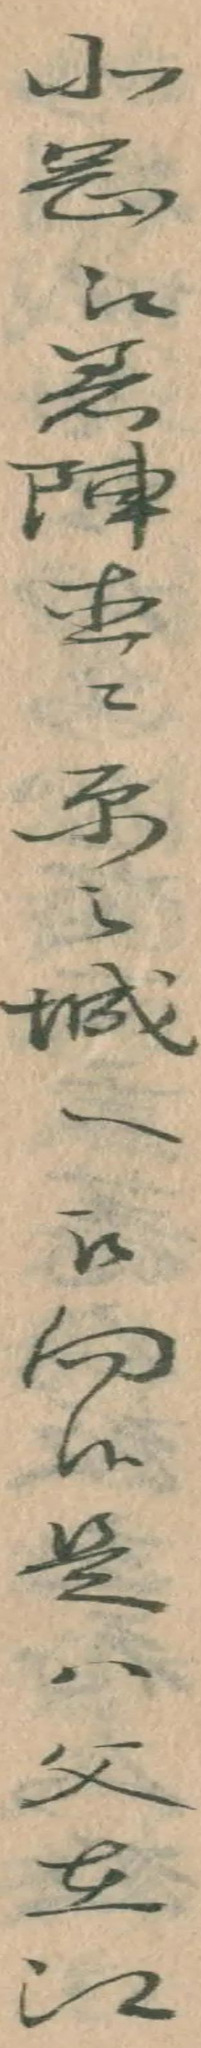北岡江着陣直に原之城へ被向候是は父在江
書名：切支丹御退治記 49巻. [4]
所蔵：国立国会図書館 National Diet Library, JAPAN
